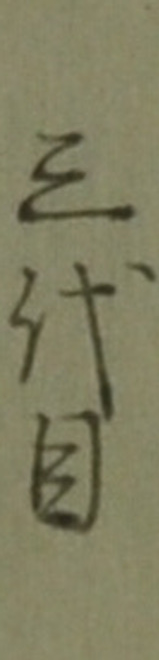三代目
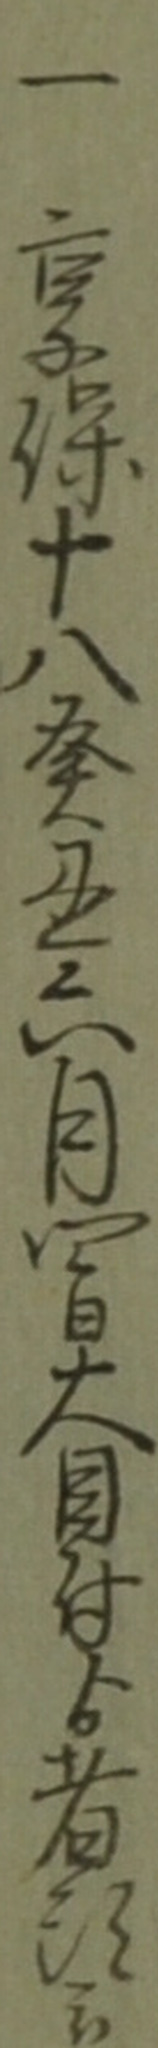一享保十八癸丑六月四日大目付ゟ者頭被
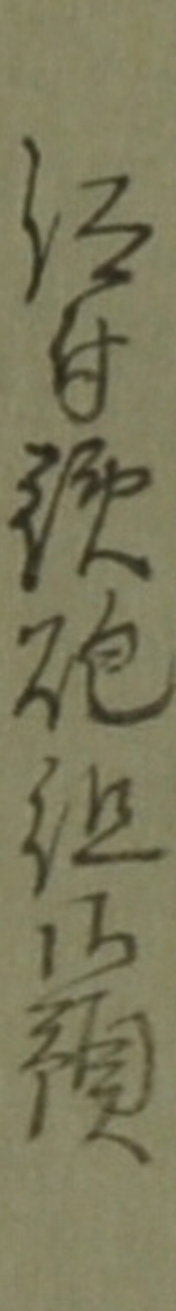仰付鉄砲組御預
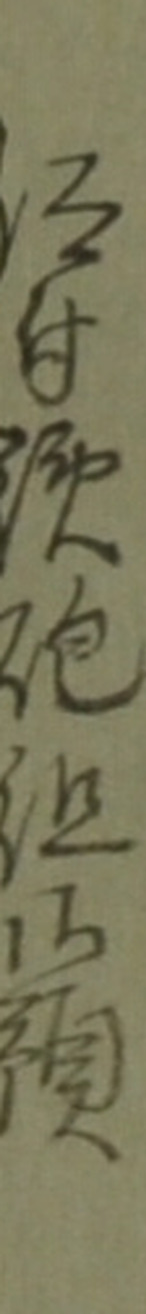仰付鉄砲組御預
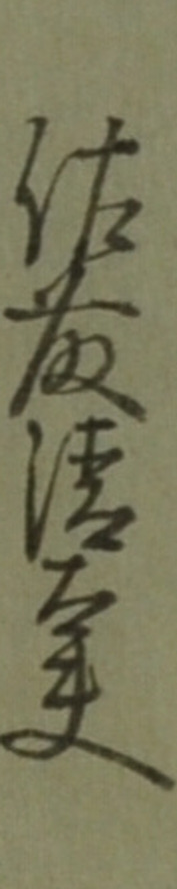佐藤清太夫
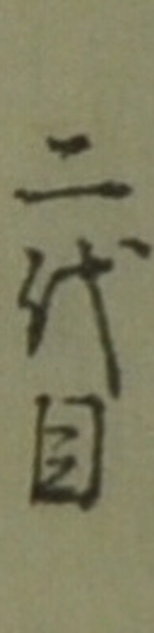二代目
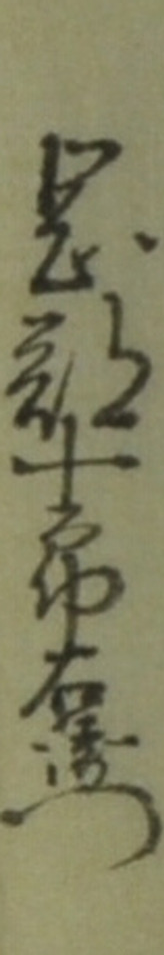岡部十郎右衛門

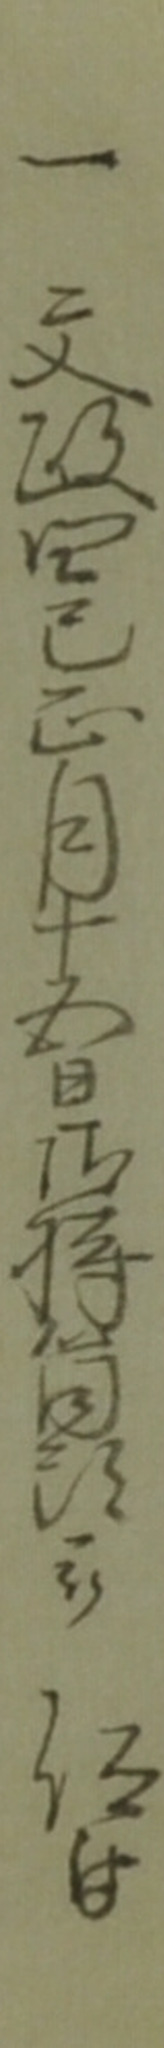一文政四巳正月十五日御持筒頭被仰付
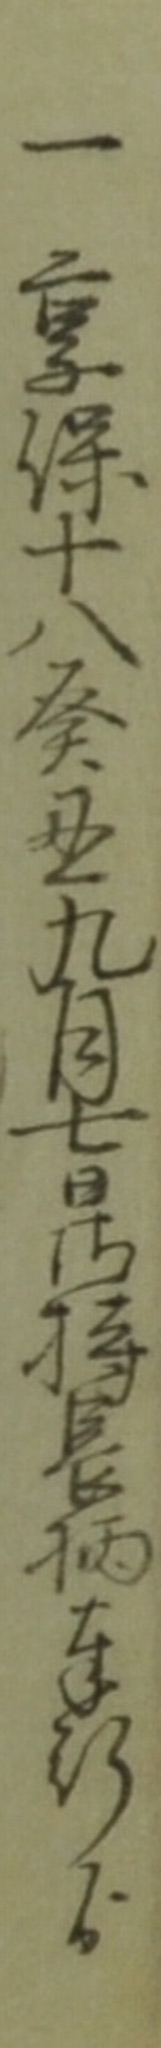一享保十八癸丑九月七日御持長柄奉行ゟ
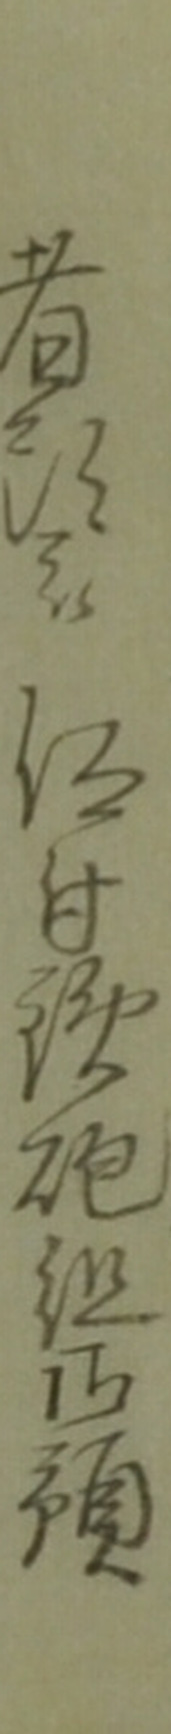者頭被仰付鉄砲組御預
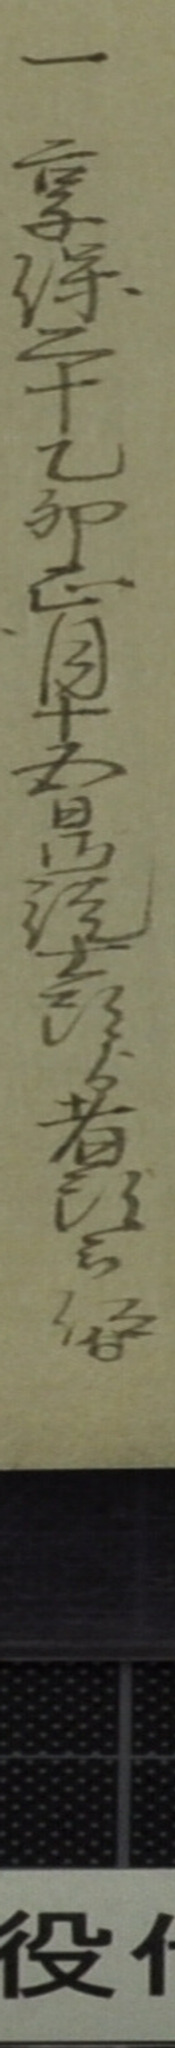一享保二十乙卯正月十五日御徒士頭ゟ者頭被仰付
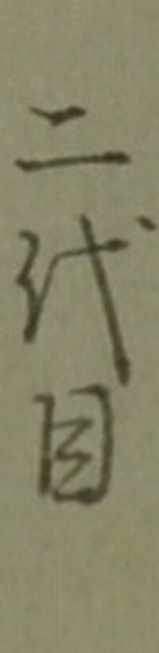二代目
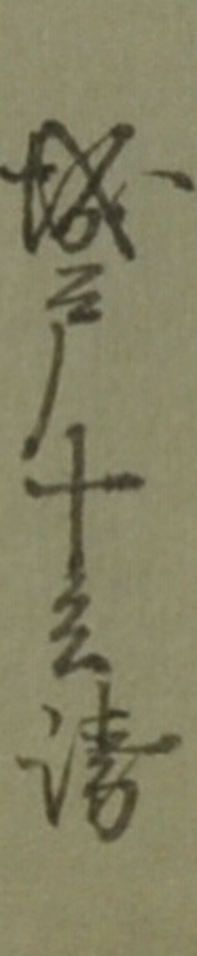城戸十兵衛
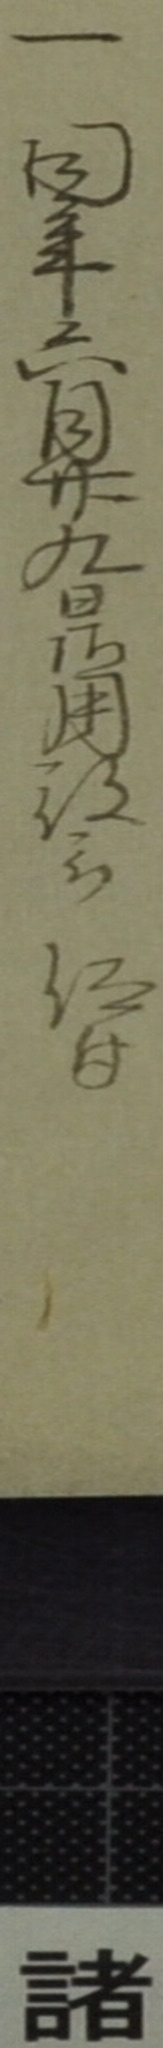一同年六月廿九日御用役被仰付
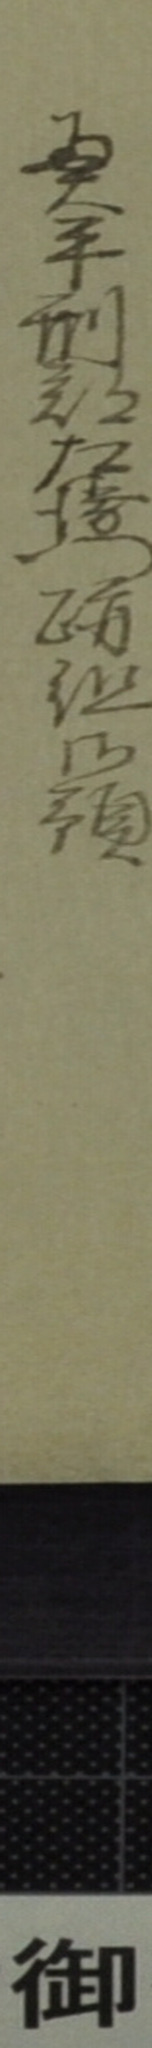奥平刑部左衛門跡組御預
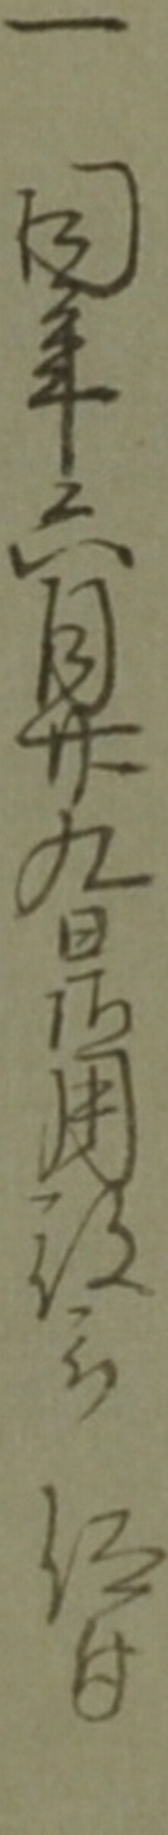一同年六月廿九日御用役被仰付
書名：諸御役代々録（二）
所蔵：伊那市立高遠町図書館・合同会社AMANE
